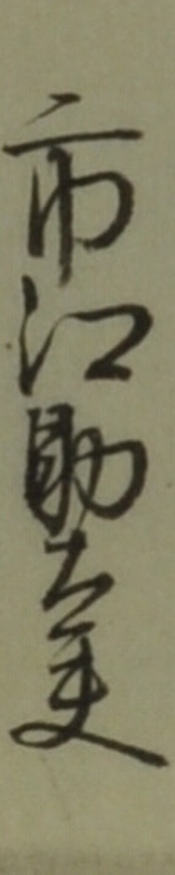市江助太夫
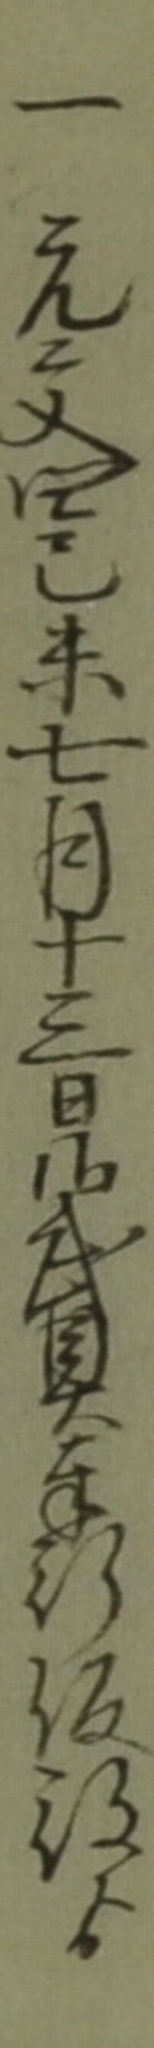一元文四己未七月十三日御武具奉行仮役ゟ
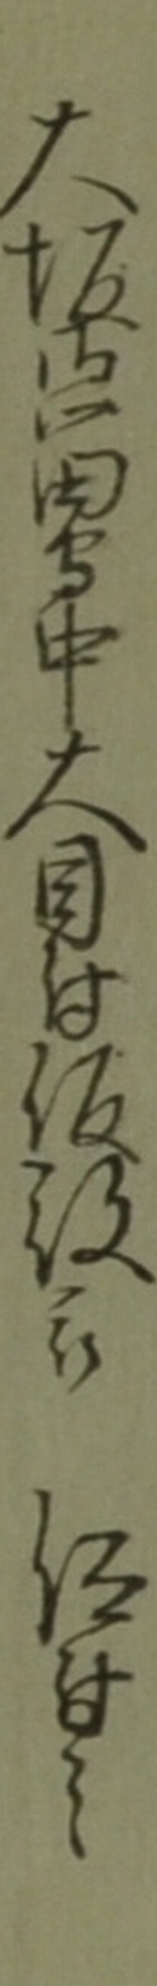大坂御留守大目付仮役被仰付之
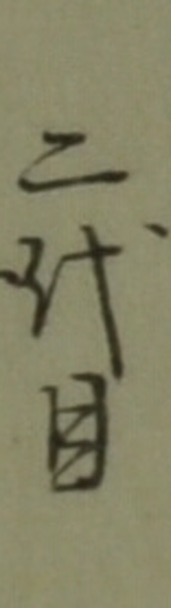二代目
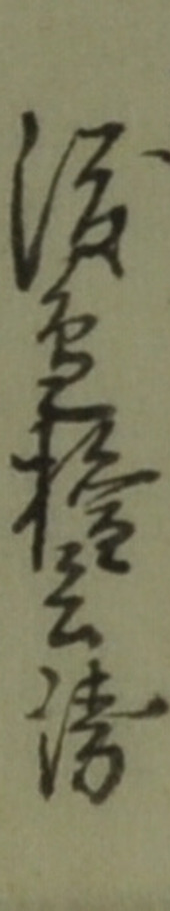渡辺権兵衛
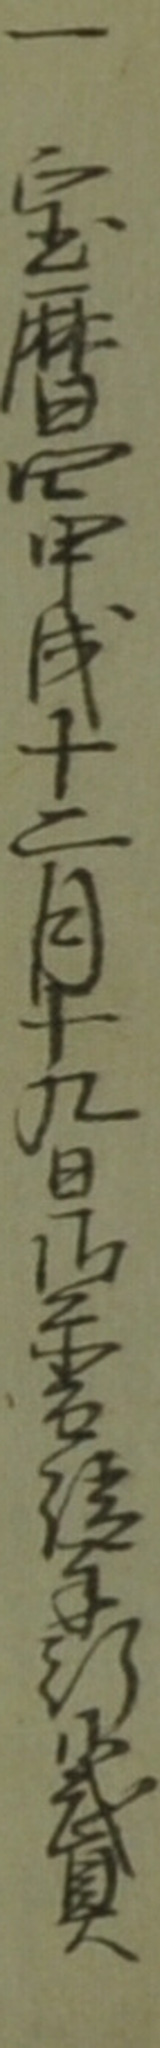一宝暦四甲戌十二月十九日御普請奉行御武具
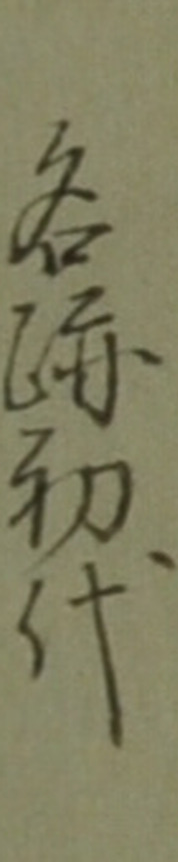名跡初代
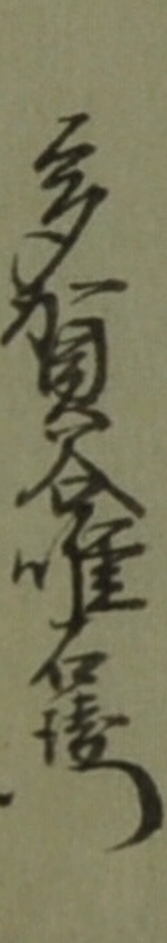多賀谷唯右衛門
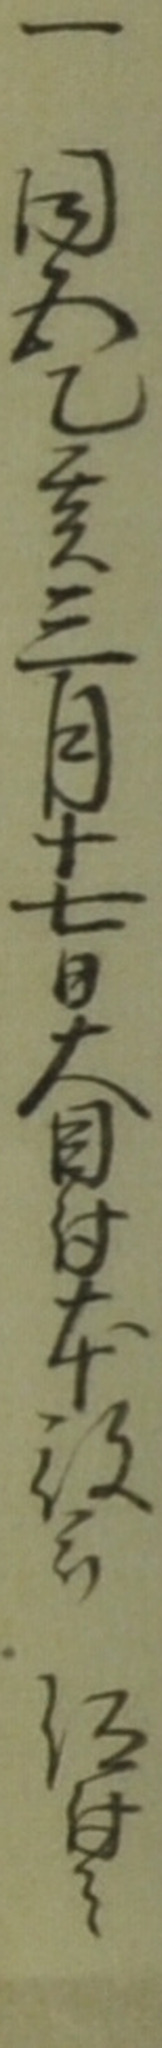同五乙亥三月十七日大目付本役被仰付之
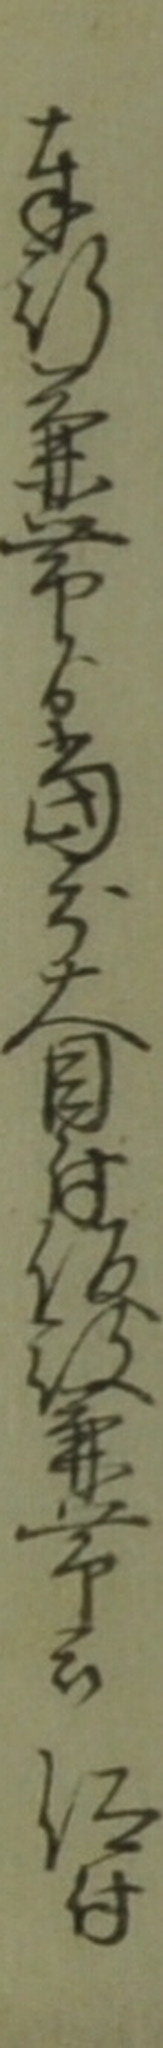奉行兼帯ゟ当分大目付仮役兼帯被仰付

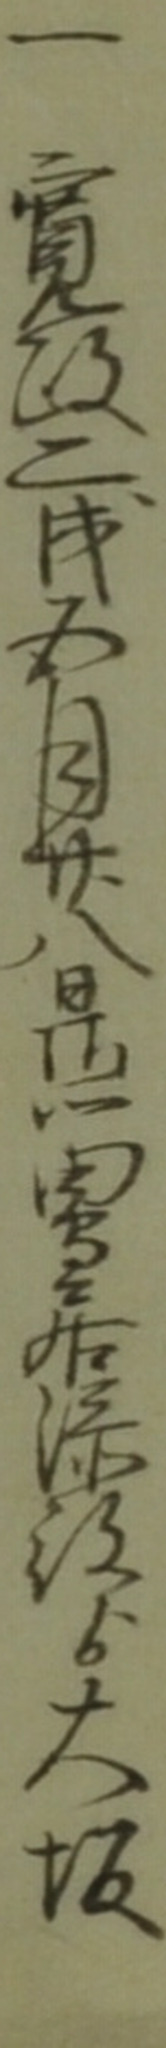一寛政二戌五月廿八日御留守居添役ゟ大坂
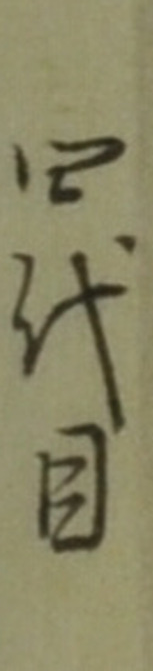四代目
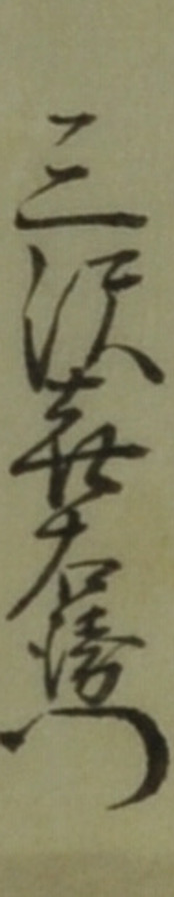三沢喜右衛門
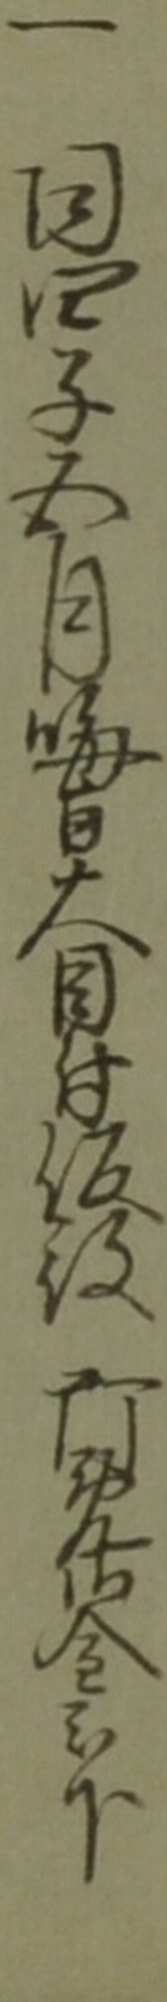一同四子五月晦日大目付仮役御免御金被下
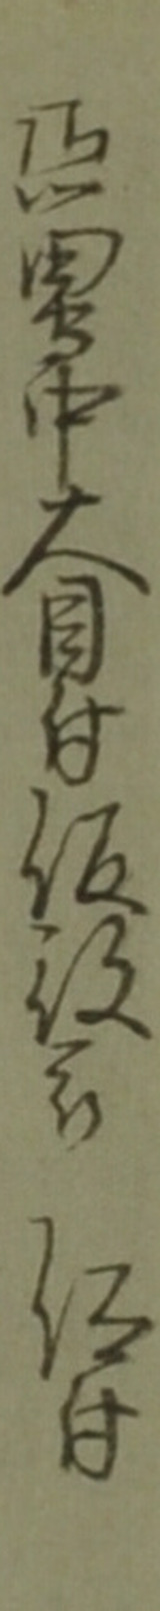御留守中大目付仮役被仰付
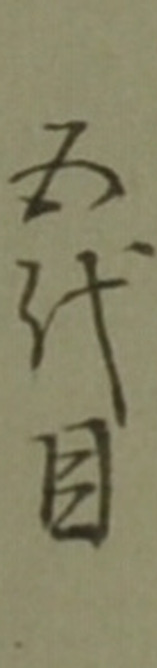五代目
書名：諸御役代々録（三）
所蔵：伊那市立高遠町図書館・合同会社AMANE
